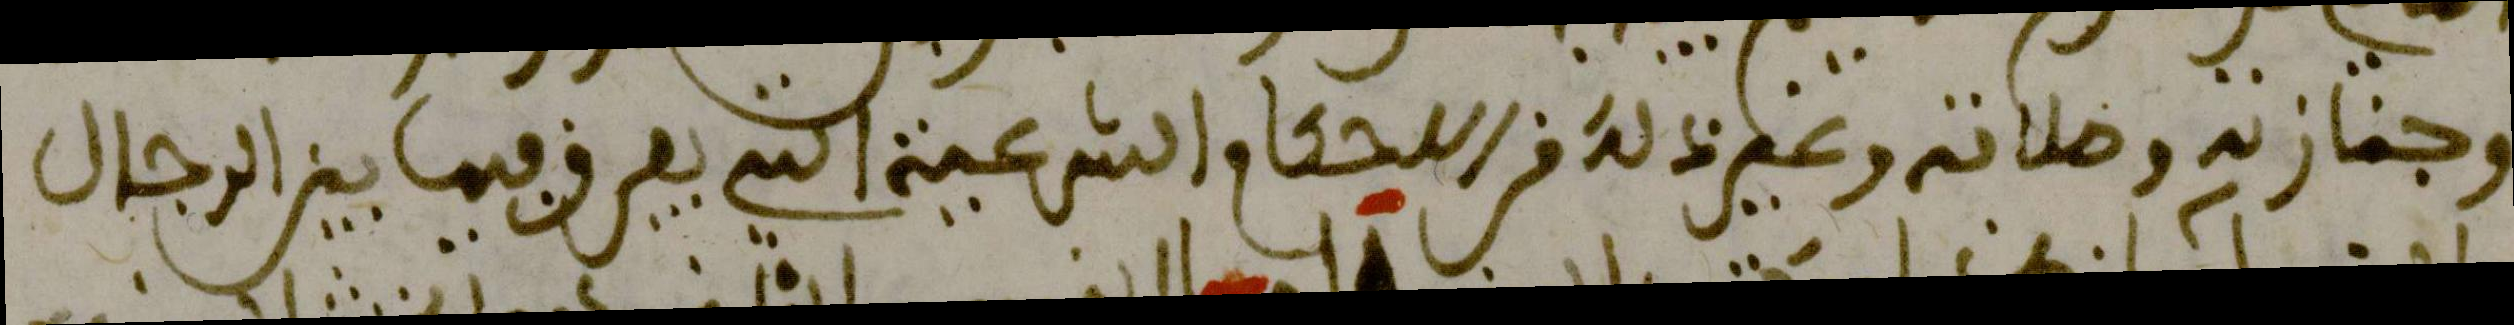وجنازته وصلاته وغير ذلك من الاحكام الشرعية التي يفرق فيها بين الرجال
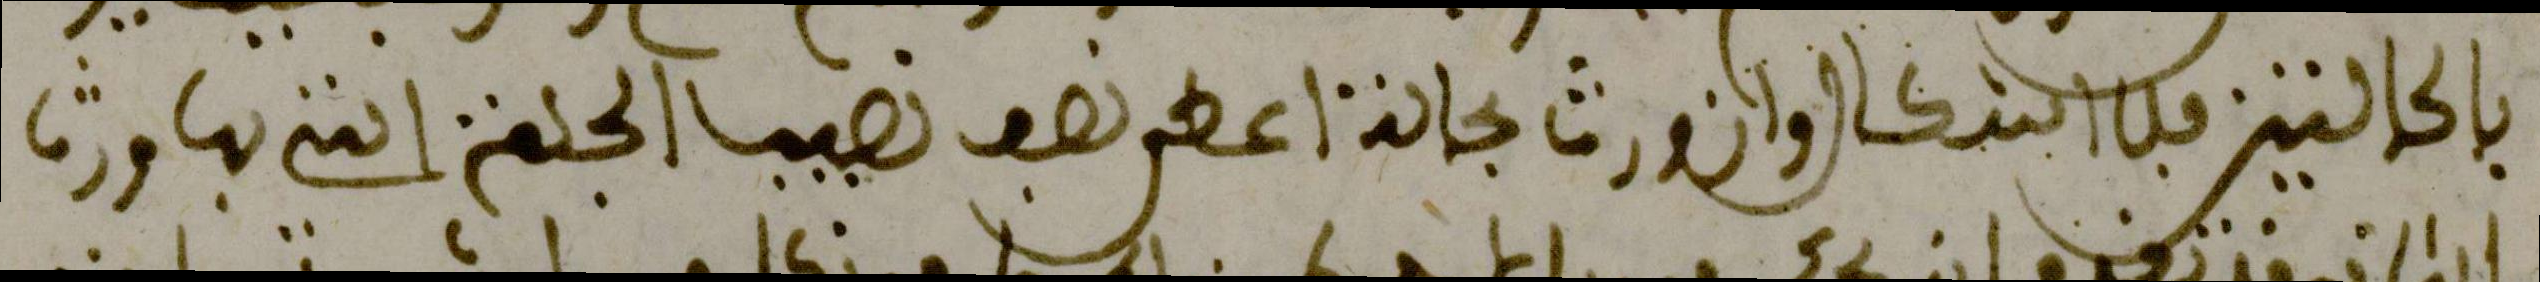بالحالتين فلا اشكال وان ورث بحالة اعطى نصف نصيب الجهة التي بها ورث
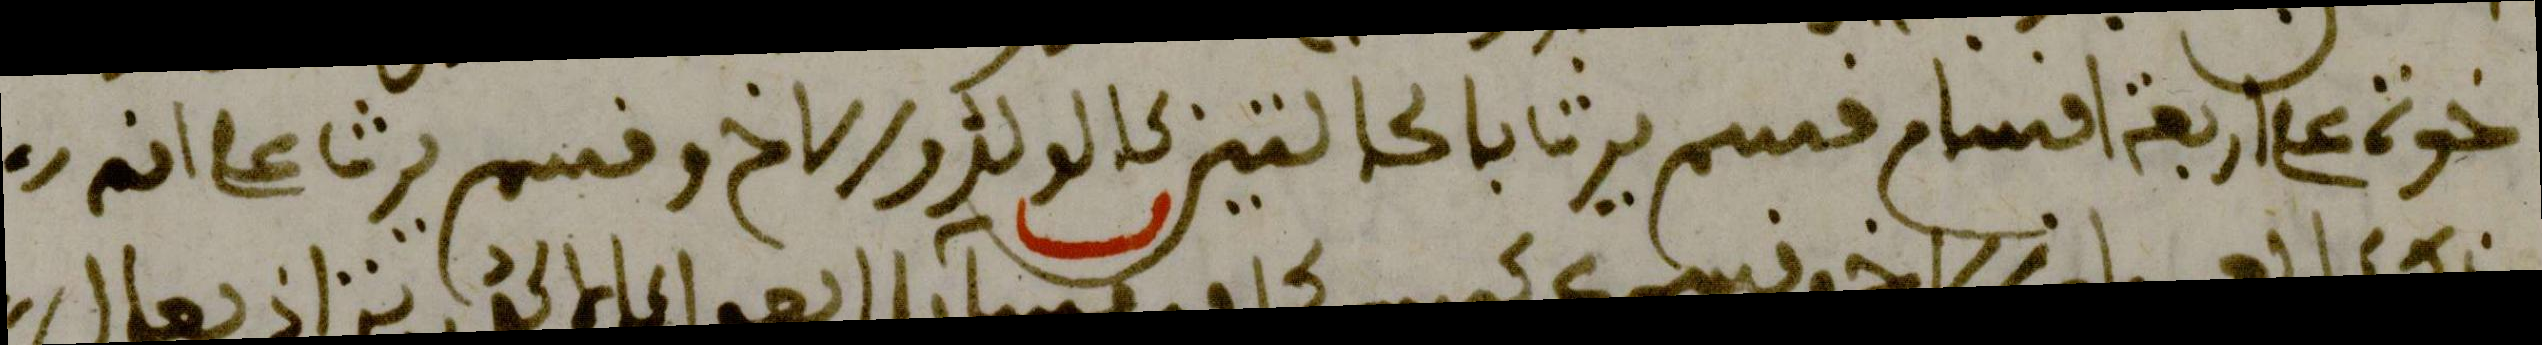خوة على اربعة اقسام قسم يرث بالحالتين كالولد والاخ وقسم يرث على انه
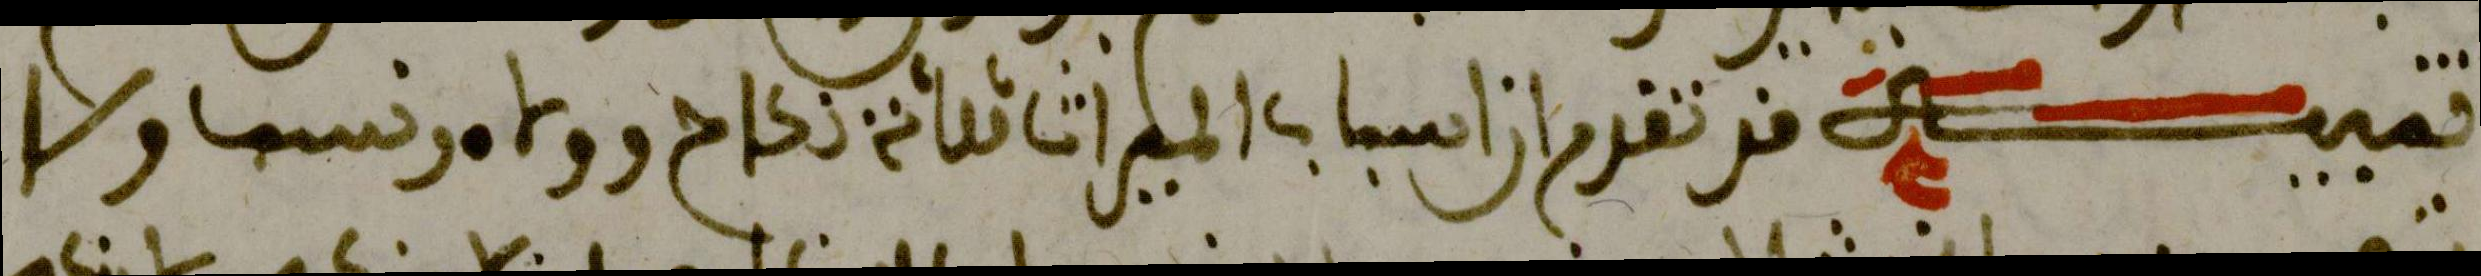تنبيه قد تقدم ان اسباب الميراث ثلاثة نكاح وولاء ونسب ولا
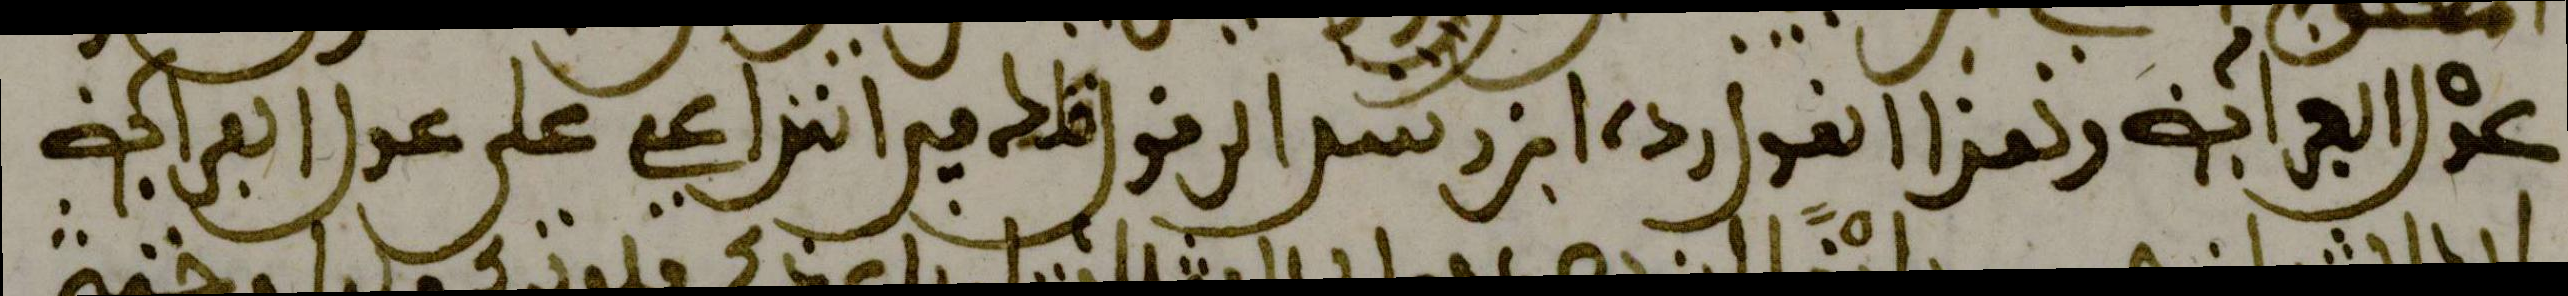عوْل الفرائض وهذه القول رده ابن رشد الى قول ملك في التداعي على عول الفرائض
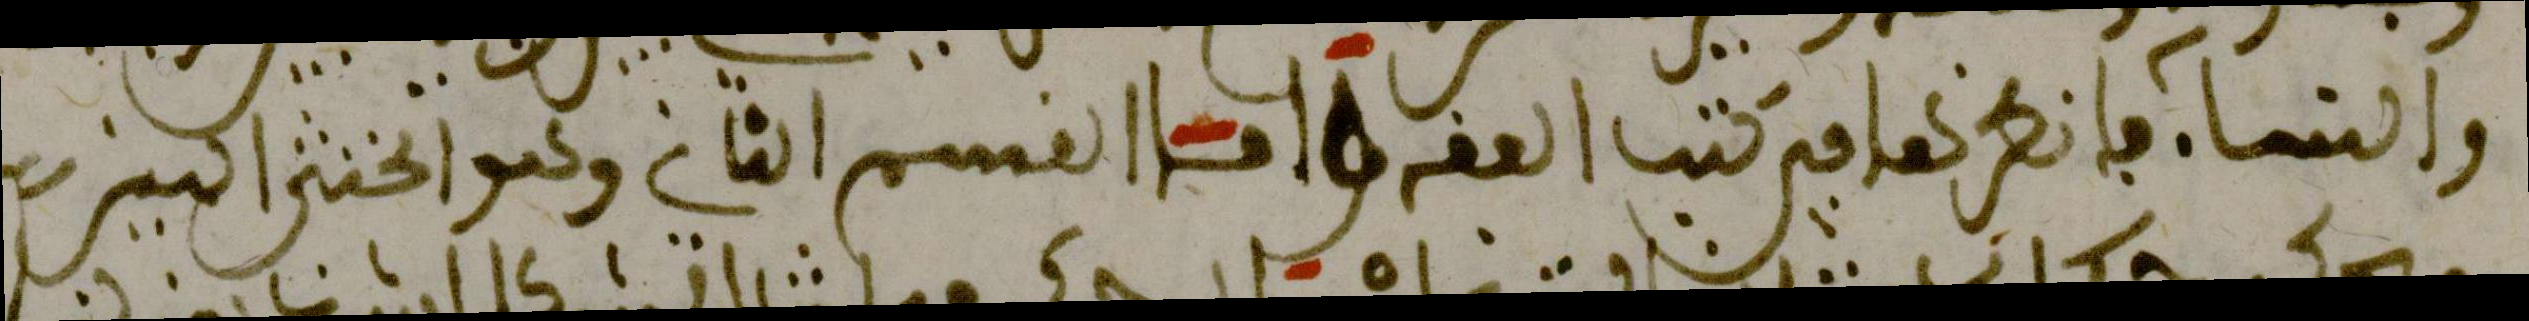والنساء فانظرها في كتب الفقه وَامَا القسم الثاني وهو الخنثى البين
